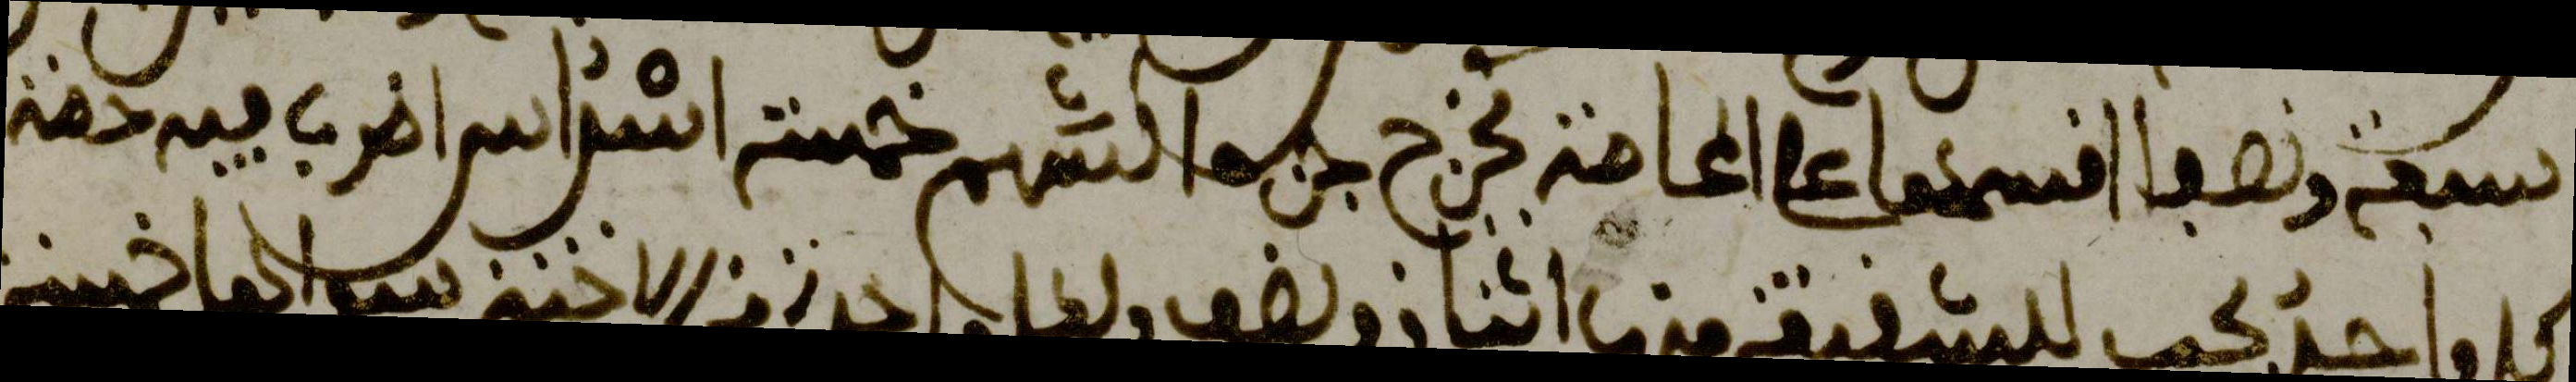سبعة ونصفا اقسهما على المحاصة يخرج جزء السّهم خمسة اسداس اضرب فيه حصة
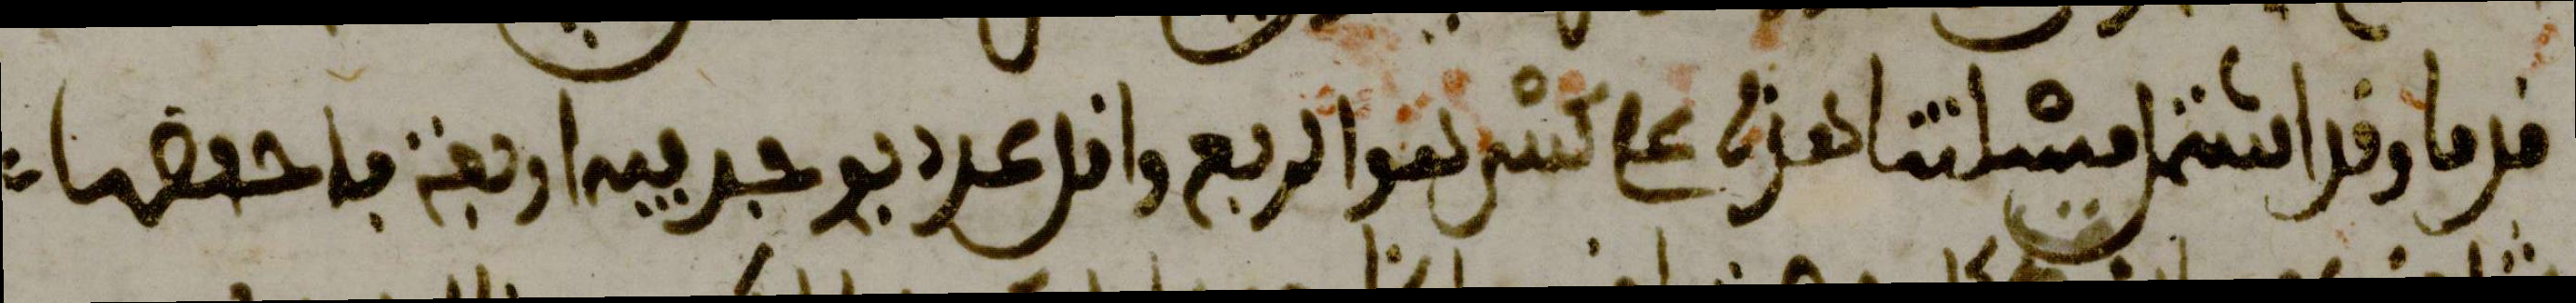قدما وقد اشتمل مسلتنا هذه على كسر هوا الربع واقل عدد بوجد فيه اربعة فاحفضها
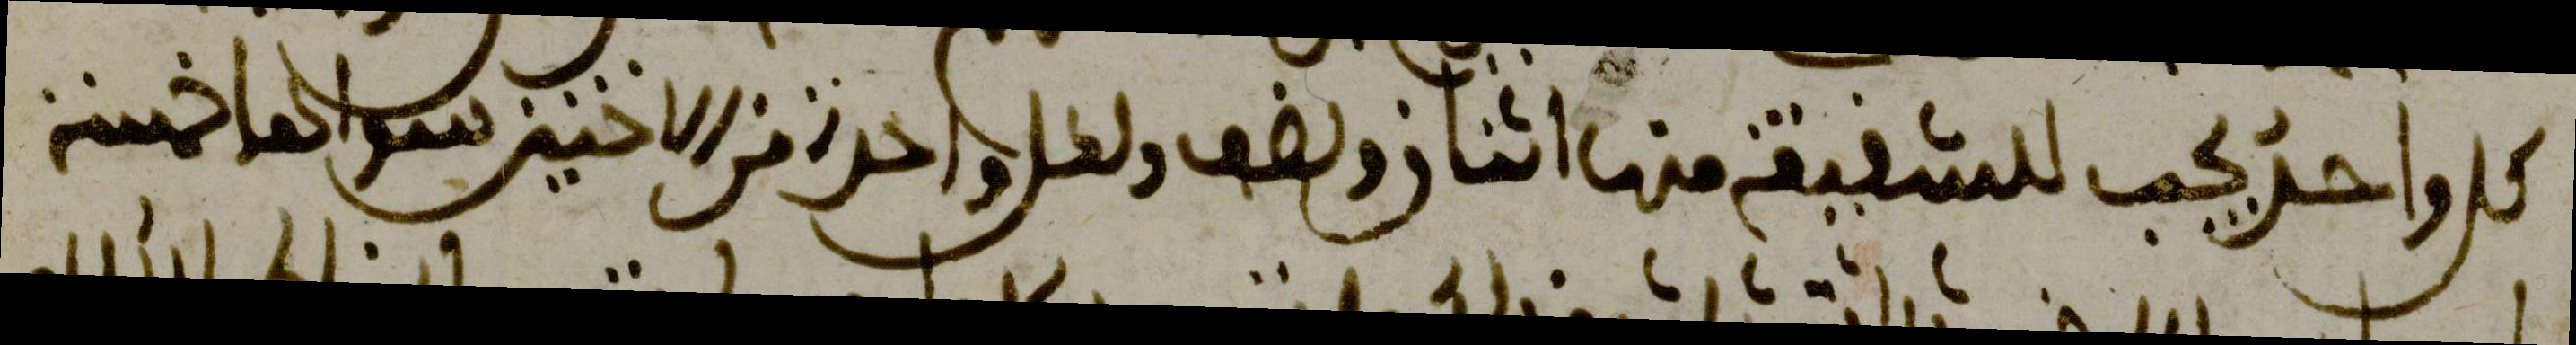كل واحد يجب للشقيقة منها اثنان ونصف ولكل واحدة من الاختين سواها خمسة
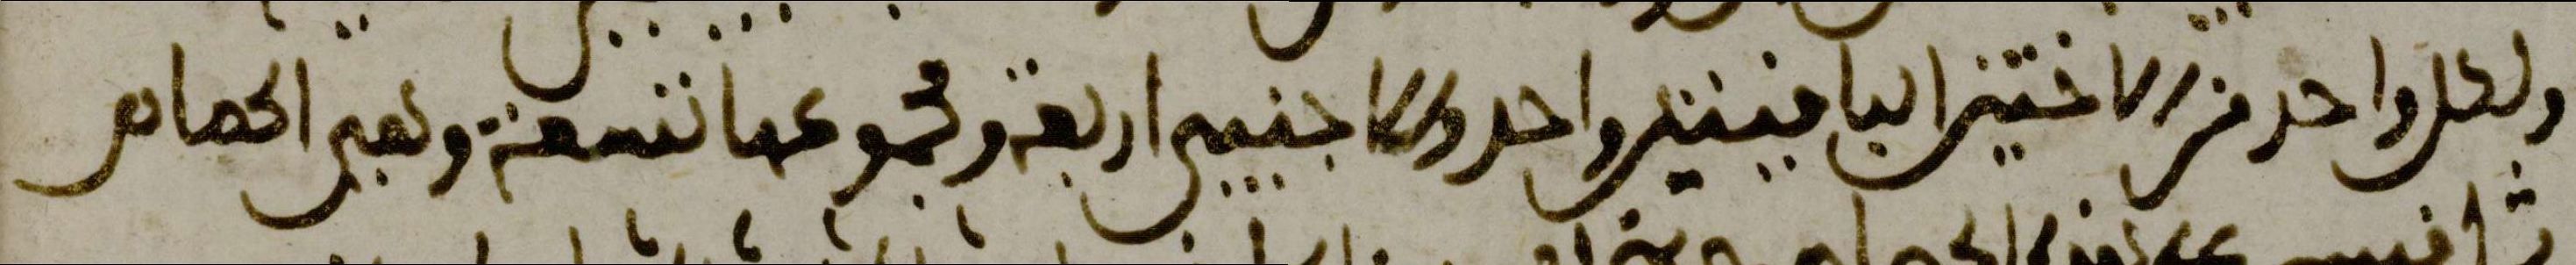ولكل واحد من الاختين الباقيتين واحد والاجنبين اربعة ومجموعها تسعة وهي الحصاص
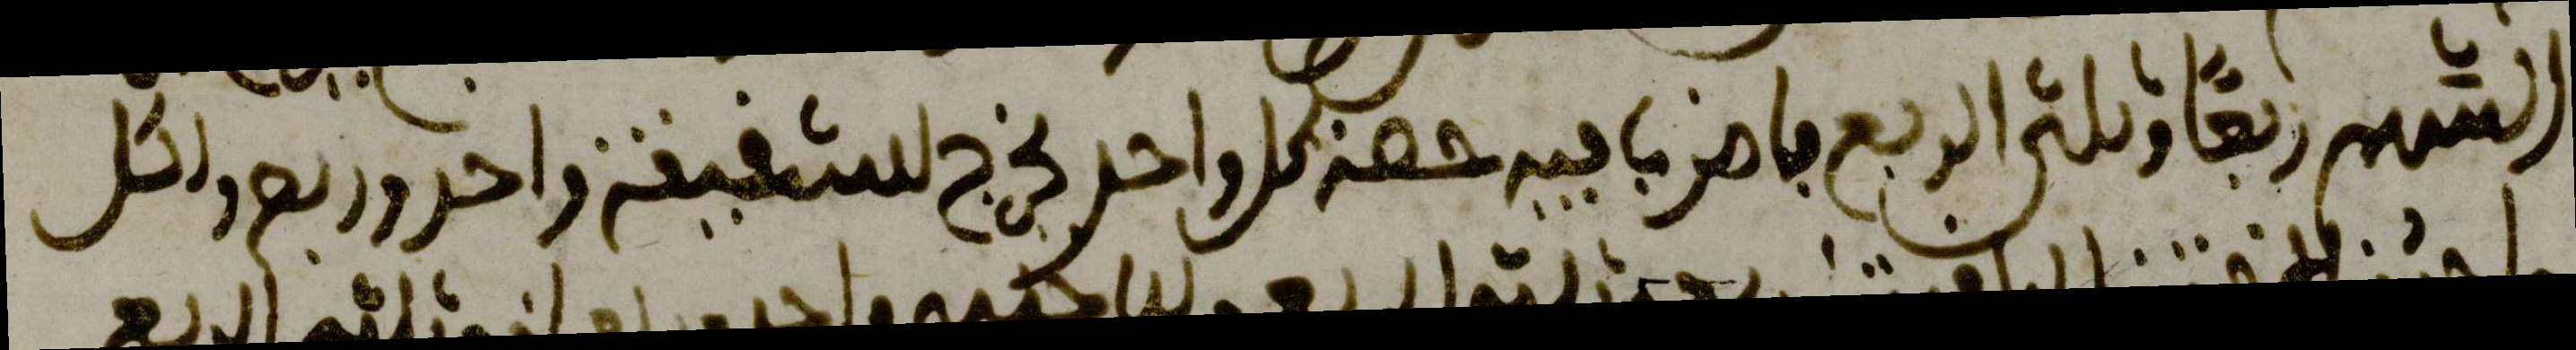السّهم ربعا وثلثى الربع فاضرب فيه حصة كل واحد يخرج للشقيقة واحد وربع ولكل
